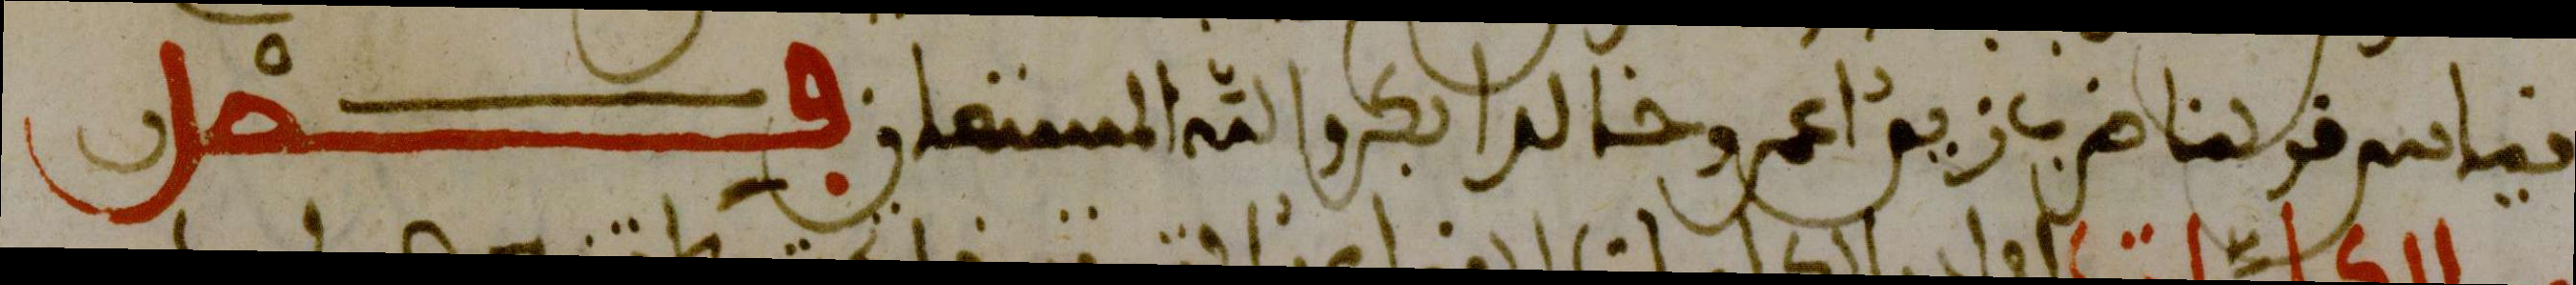قياس قولنا ضرب زيد اعمر وخالد ابكر والله المستعان فَصْل
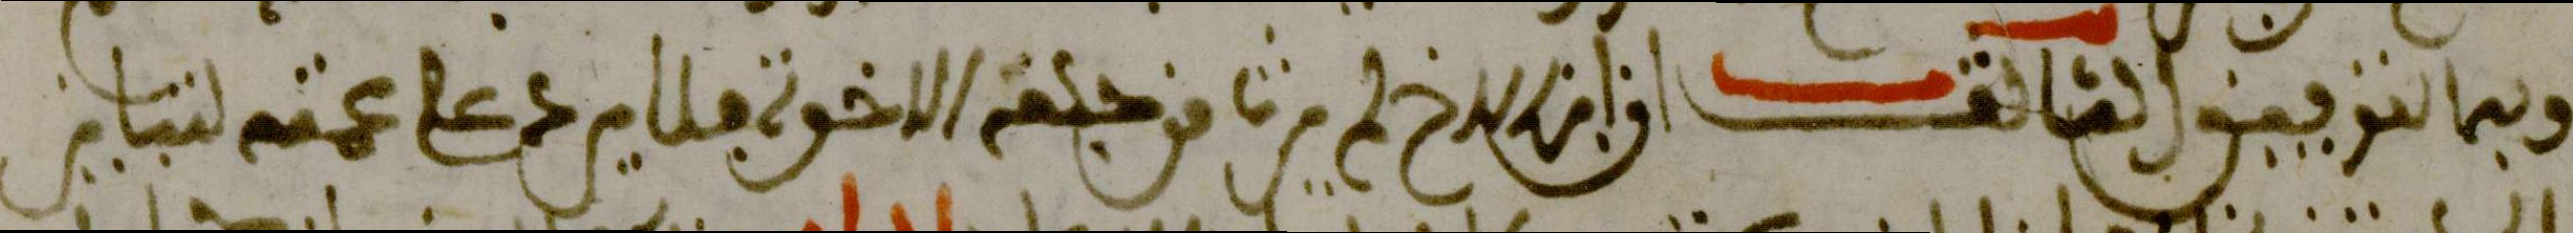وبه التوفيق الثالث ان ابن الاخ لم يرث من جهة الاخوة فلا يرد على عمته لتباين
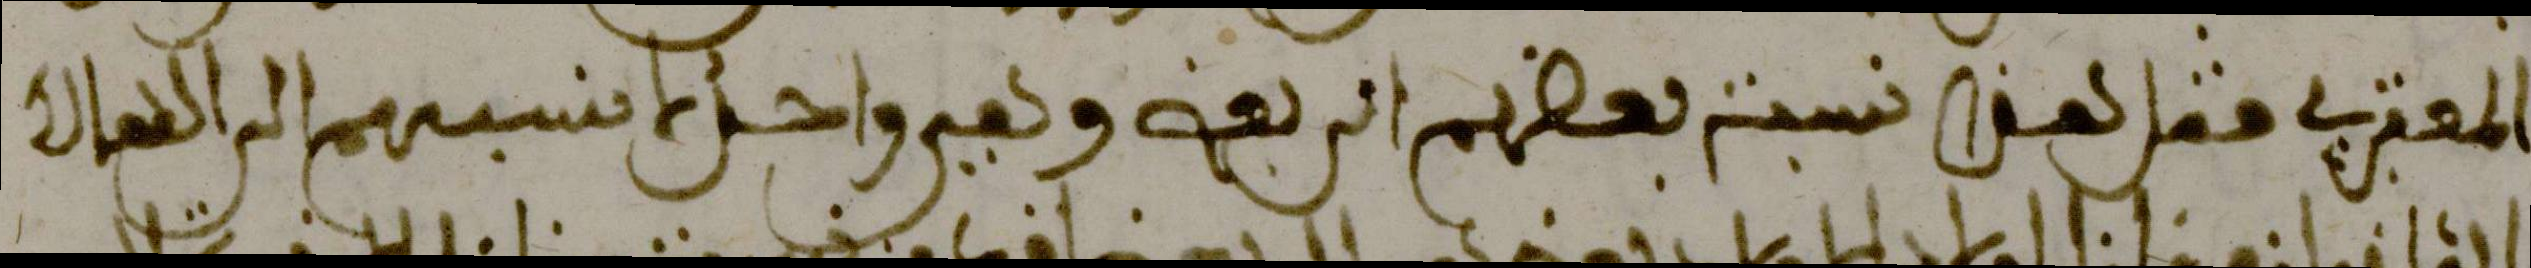المعتبر في مثل هذا نسبة بعضهم الى بعض وهي واحد لا نسبهم الى الهالك
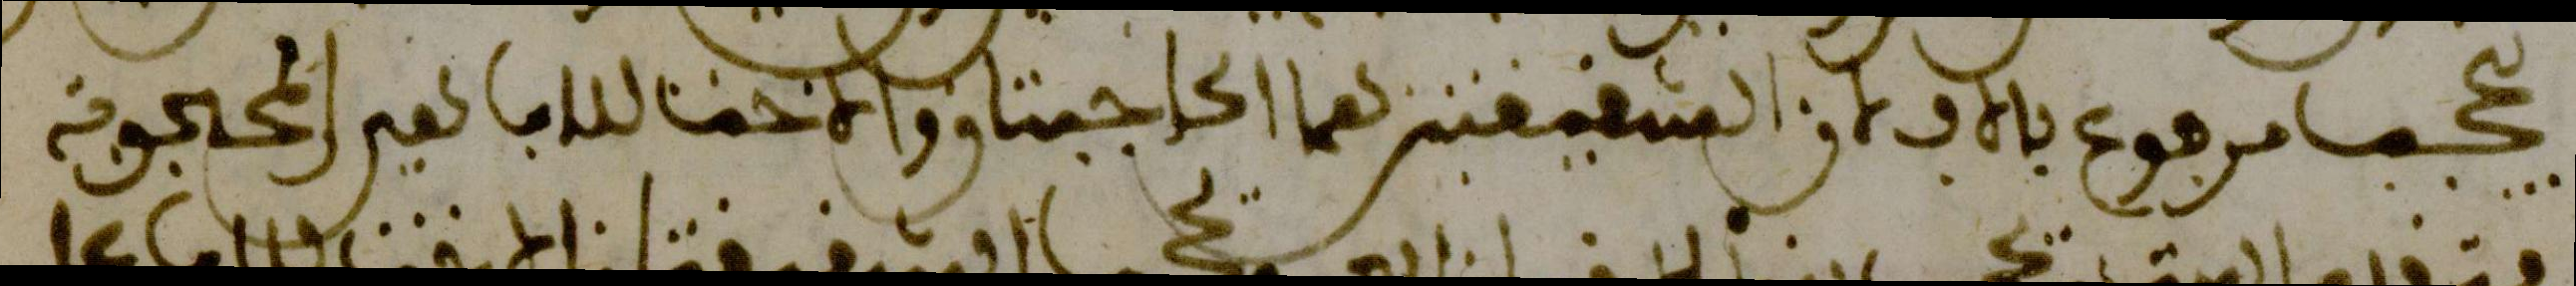يحجب مرفوع بالالف لان الشقيقتين هما الحاجبتان والاخت للاب هي المحجوبة
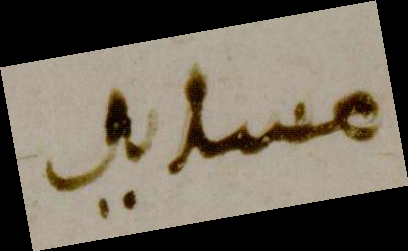مسايل
